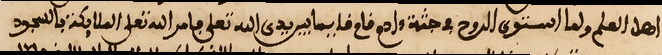اهل العلم لما استوى الروح في جثة ءادم قام قايما بين يدى الله تعلى فامر الله تعلى الملائكة بالسجود
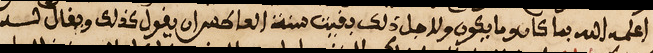اعلمه الله بما كان وما يكون ولاجل ذلك بقيت سنة العاطس ان يقول كذلك ويقال له
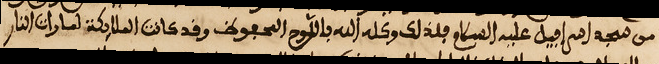من سجد اسرافيل عليه السلام فلذلك وكله الله باللوح المحفوظ وقد كانت الملائكة لما رات النار
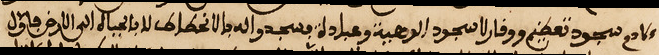ءلادم سجود تعظيم ووقار لا سجود الوهية وعبادة فسجدوا له بالانحطاط لا بالحياة الى الارض فاوّل
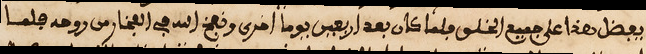يفضل هذا على جميع الخلق فلما كان بعد اربعين يوما اخرى ونفخ الله في الفخار من روحه فلما
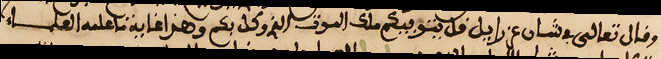وقال تعالى في شان عزرايل قل يتوفيكم ملك الموت الذي وكل بكم وهذا غاية ما علمه العلماء
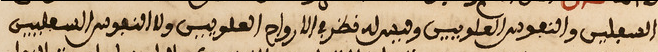السفلين والنفوس العلويين وليس له نظر في الارواح العلويين ولا النفوس السفليين
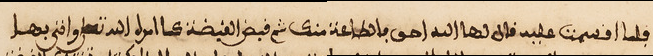فلما اقسمت عليه قال لها الله احق بالطاعة منك ثم قبض القبضة كما امره الله تعلى واتى بها
